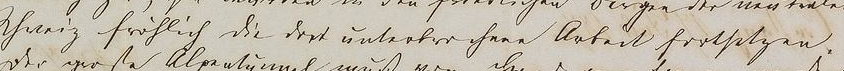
Schweiz fröhlich die dort unterbrochene Arbeit fortsetzen.
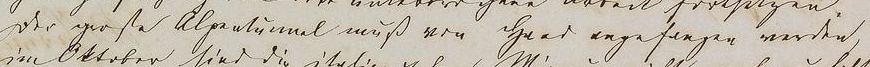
Der große Alpentunnel muß von Hand angefangen werden,
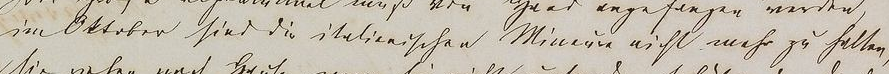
im Oktober sind die italienischen Mineure nicht mehr zu halten,
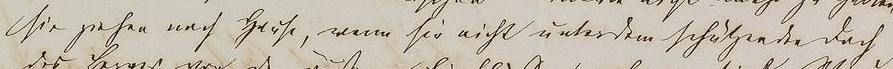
sie gehen nach Hause, wenn sie nicht unter dem schützenden Dach
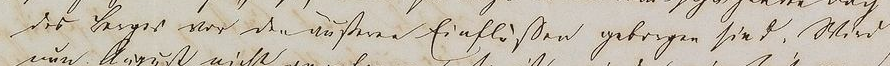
des Berges vor den äußeren Einflüssen geborgen sind. Wird
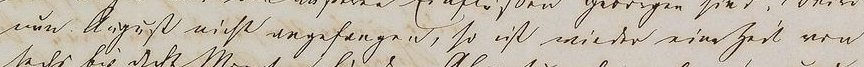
nun August nicht angefangen, so ist wieder eine Zeit von
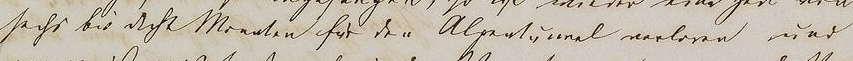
sechs bis acht Monaten für den Alpentunnel verloren und
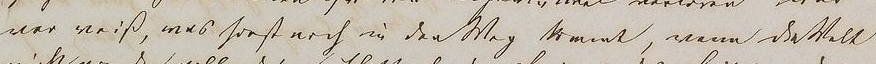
wer weiß, was sonst noch in den Weg kommt, wenn die Welt
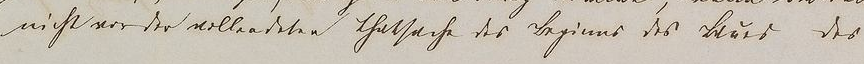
nicht vor der vollendeten Thatsache des Beginns des Baus des
